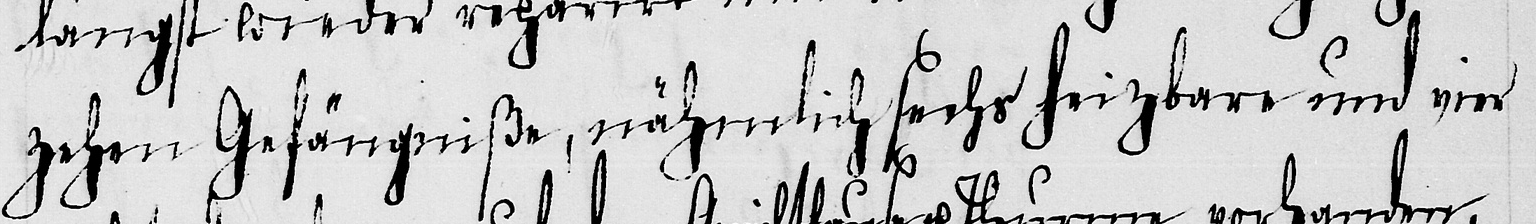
zehen Gefängniße, nähmlich sechs heizbare und vier
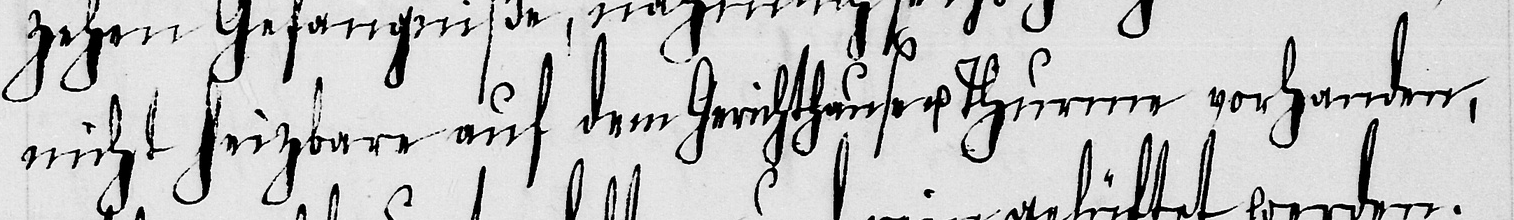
nicht heizbare auf dem Gerichtshause u. Thurme vorhanden,
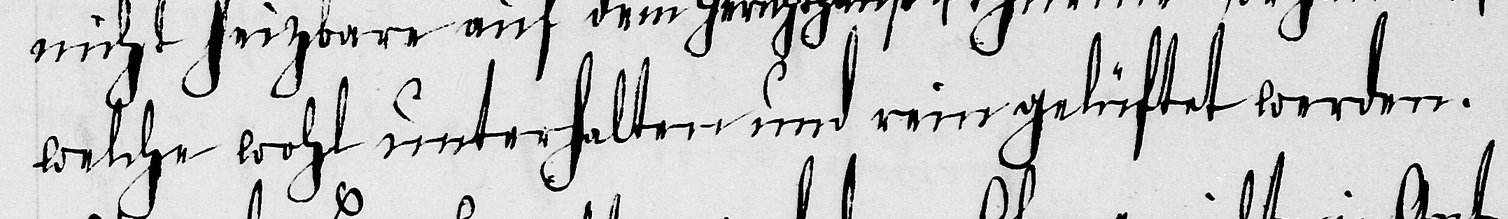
welche wohl unterhalten und rein gelüftet werden.
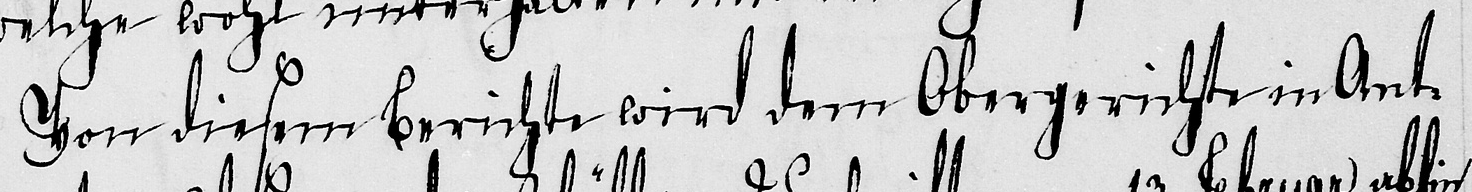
Von diesem Berichte wird dem Obergerichte in Ant¬
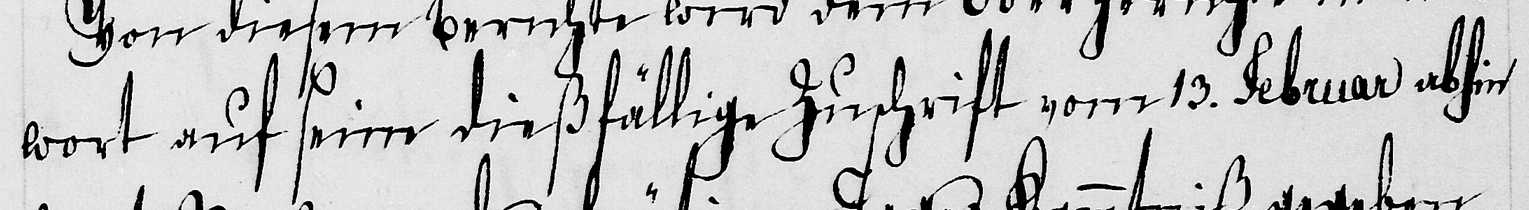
wort auf seine dießfällige Zuschrift vom 13. Februar abhin
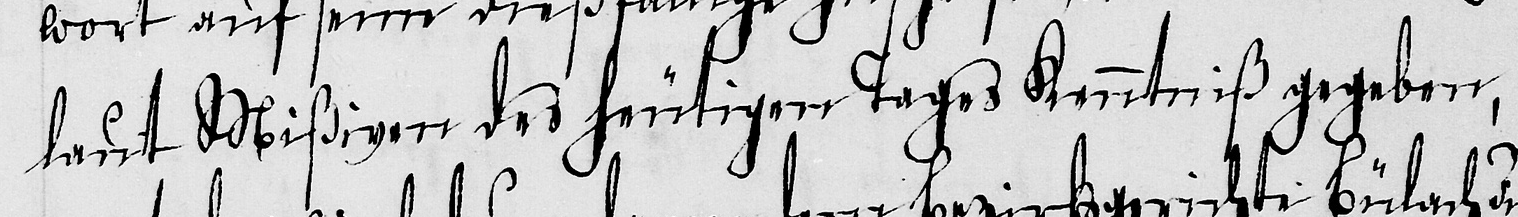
laut Mißiven des heutigen Tages Kenntniß gegeben,
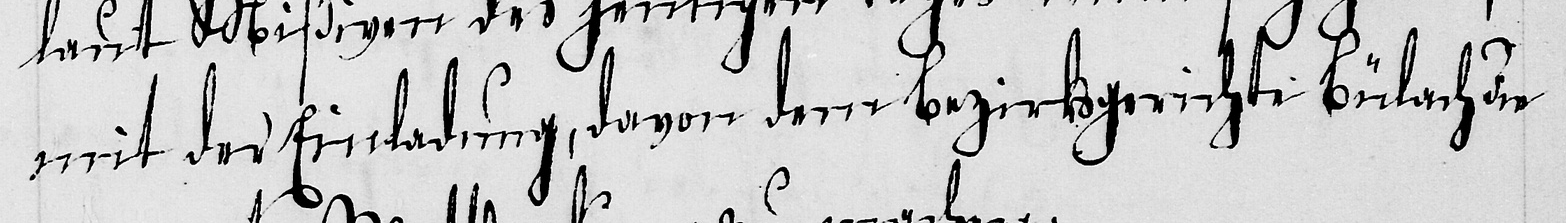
mit der Einladung, davon dem Bezirksgerichte Bülach die
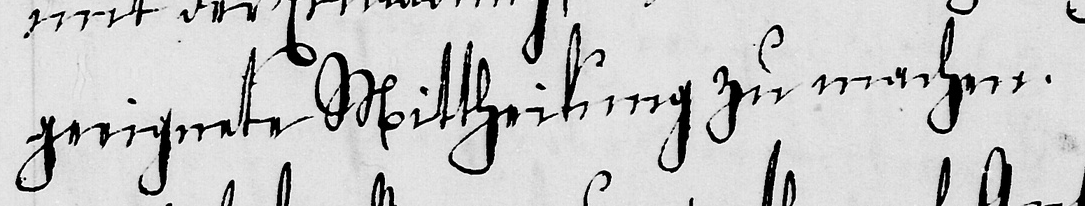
geeignete Mittheilung zu machen.
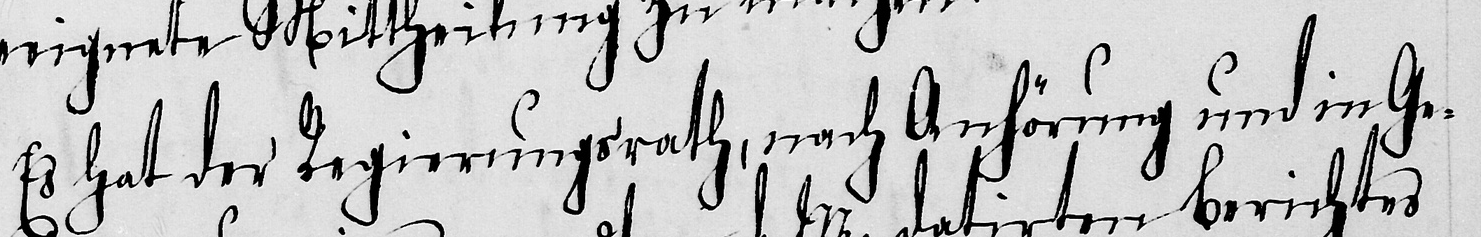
Es hat der Regierungsrath, nach Anhörung und in Ge¬
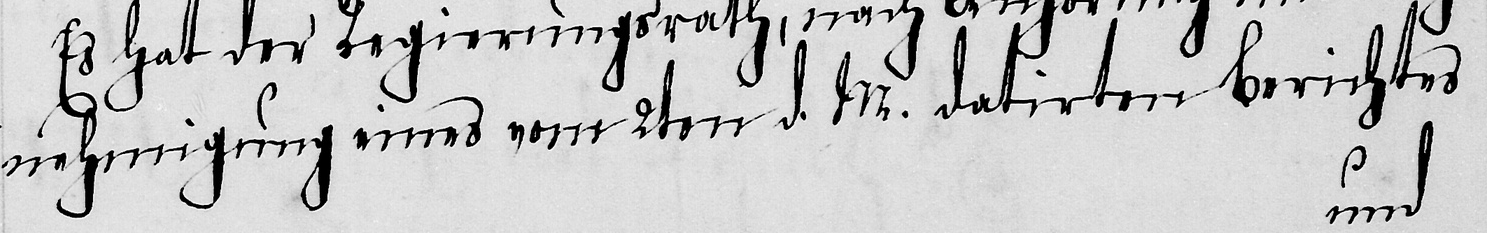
nehmigung eines vom 2ten d. M. datirten Berichtes
